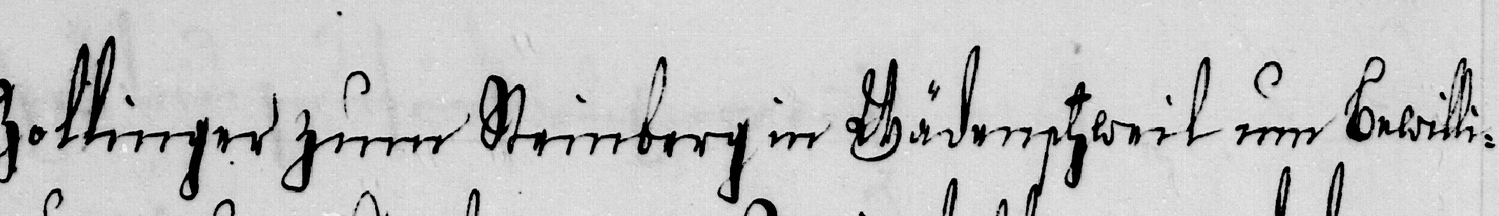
Zollinger zum Steinberg in Wädenschweil um Bewill¬
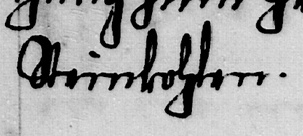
Steinkohlen,
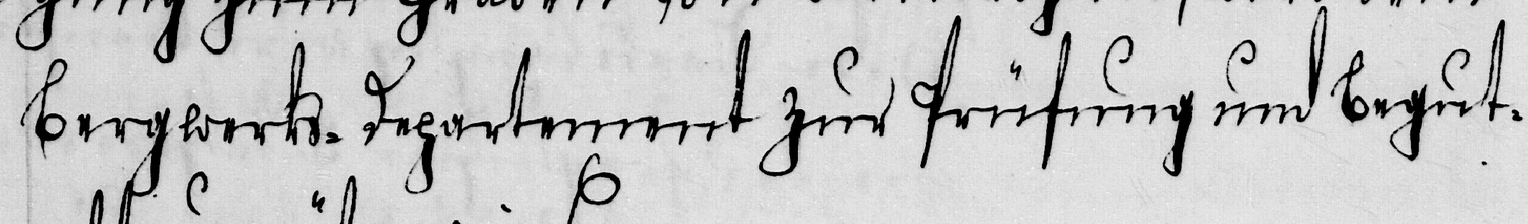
Bergwerks-Departement zur Prüfung und Begut¬
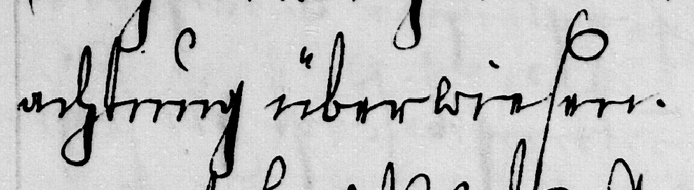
achtung überwiesen.
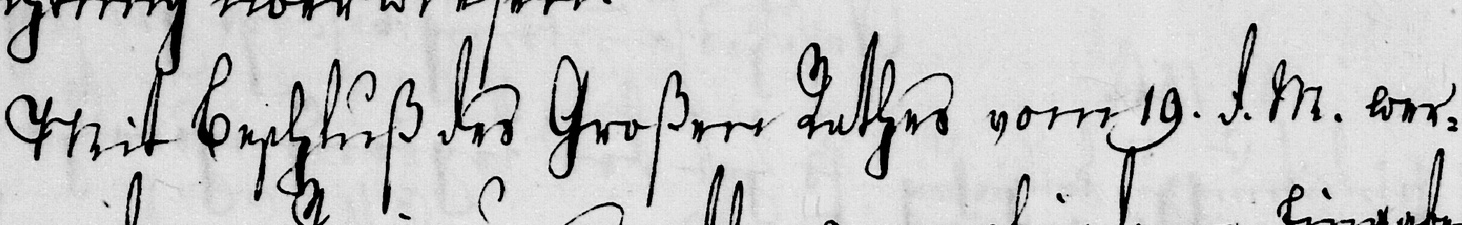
Mit Beschluß des Großen Rathes vom 19. d. M. wer¬
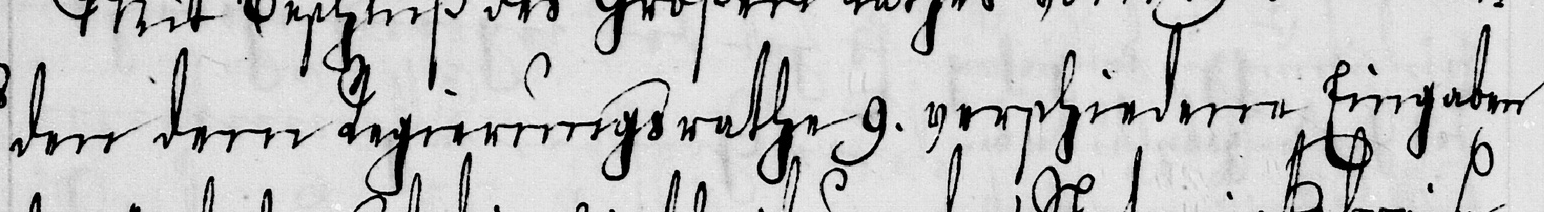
den dem Regierungsrathe 9. verschiedene Eingaben
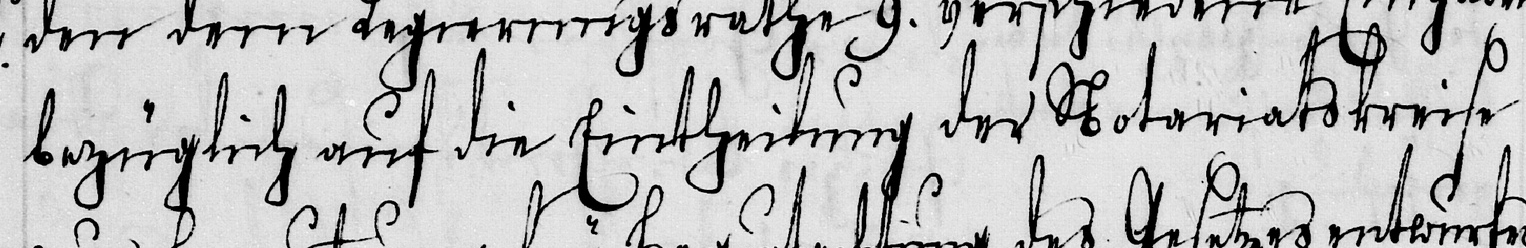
bezüglich auf die Eintheilung der Notariatskreise
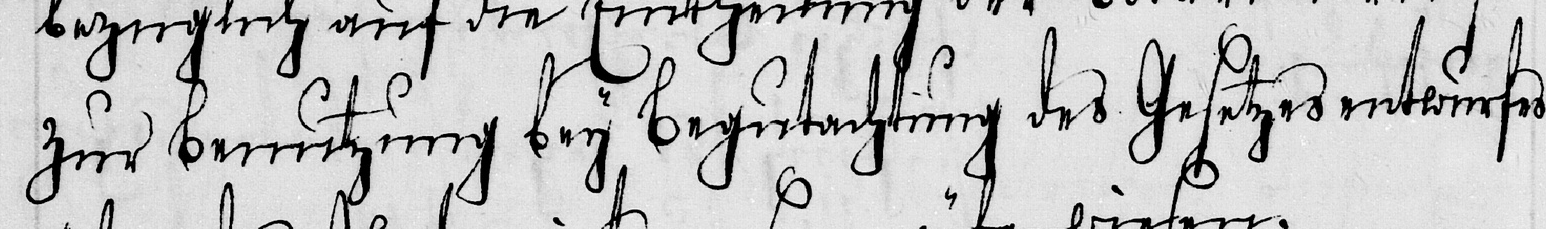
zur Benutzung bey Begutachtung des Gesetzesentwurfes
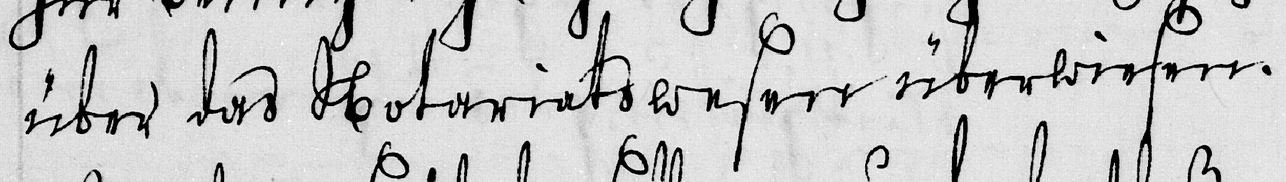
über das Notariatswesen überwiesen.
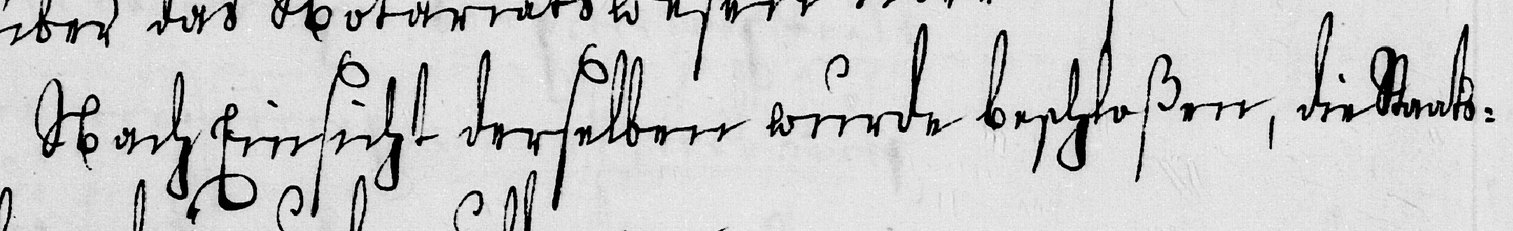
Nach Einsicht derselben wurde beschloßen, die Sta¬
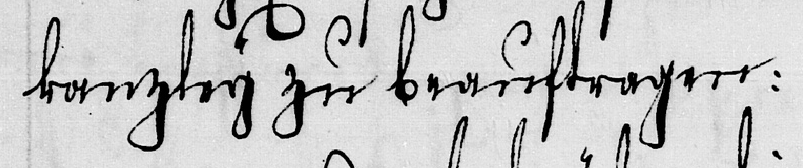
skanzley zu beauftragen:
